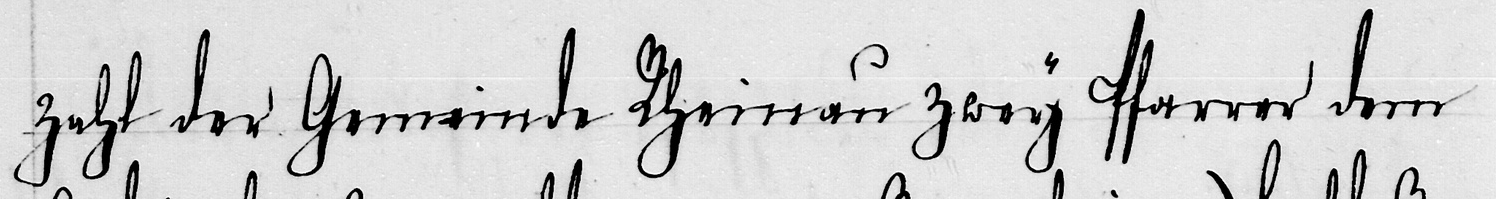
zahl der Gemeinde Rheinau zwey Pfarrer dem
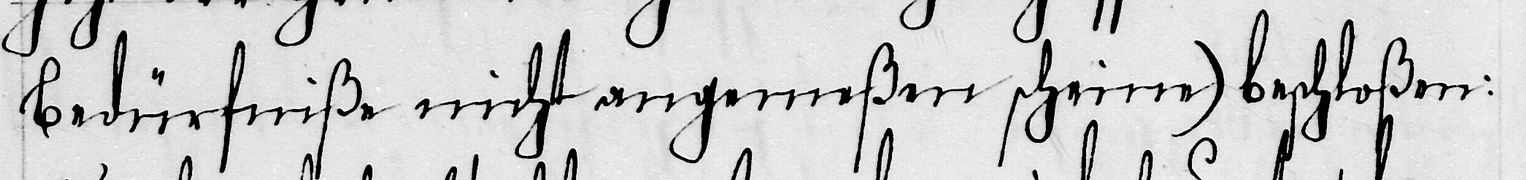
Bedürfniße nicht angemeßen scheine[n]) beschloßen:
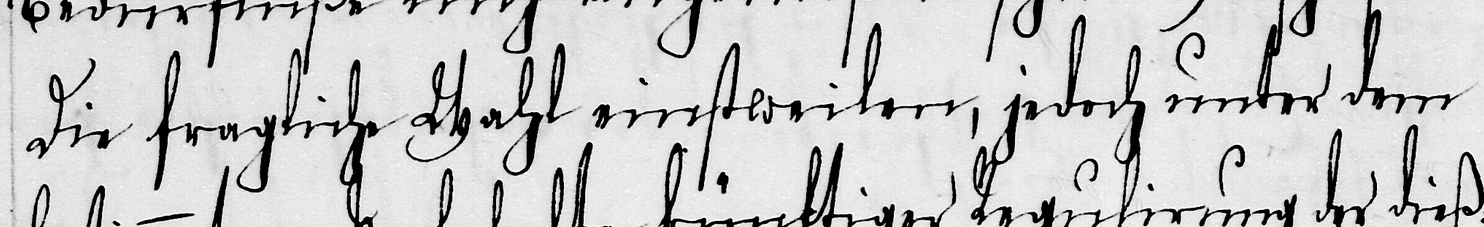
Die fragliche Wahl einstweilen, jedoch unter dem
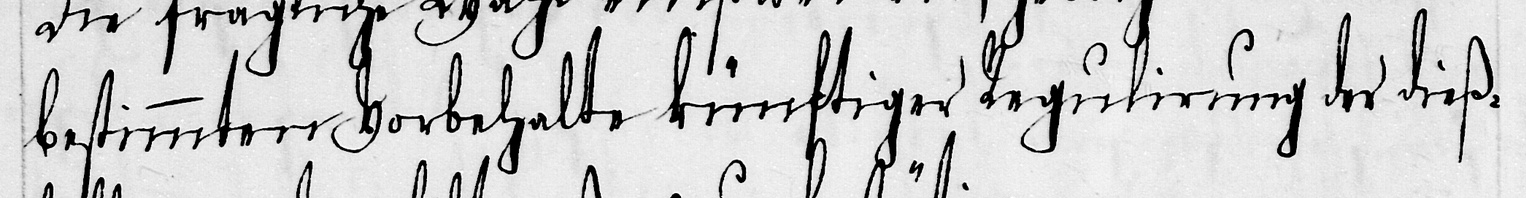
bestimmten Vorbehalte künftiger Regulirung der dieß¬
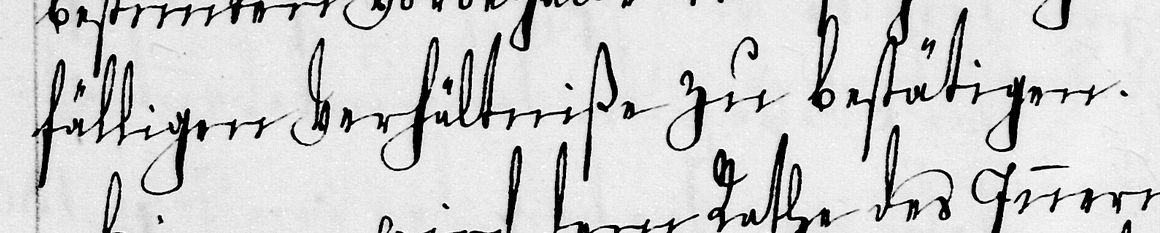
fälligen Verhältniße zu bestätigen.
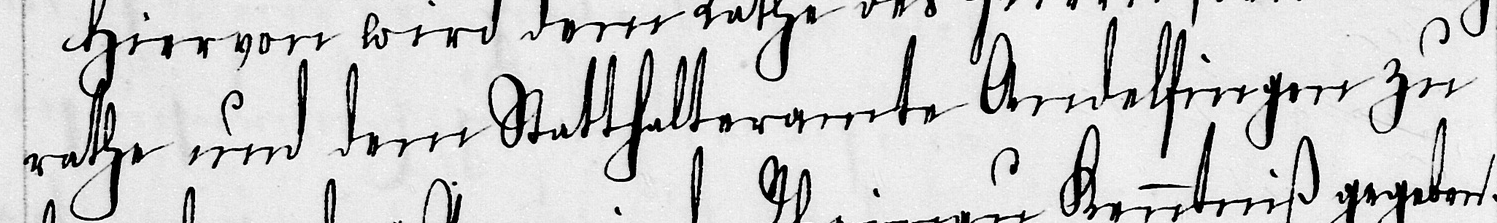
rathe und dem Statthalteramte Andelfingen zu
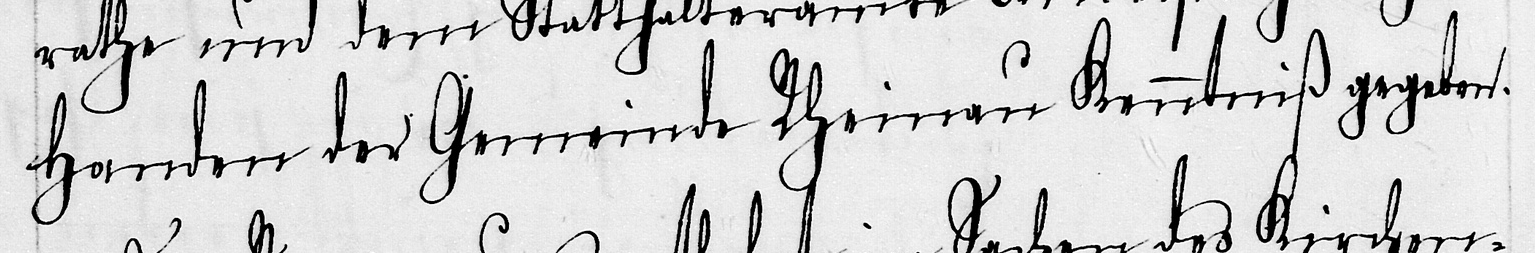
Handen der Gemeinde Rheinau Kenntniß gegeben.
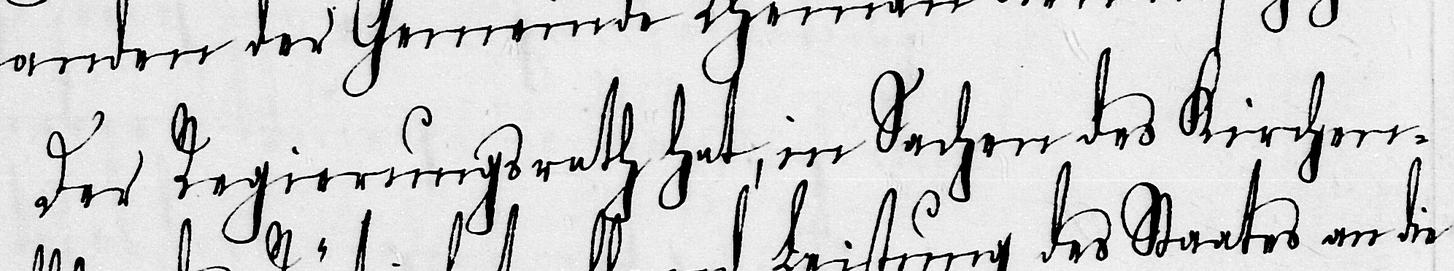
Der Regierungsrath hat, in Sachen des Kirchens¬
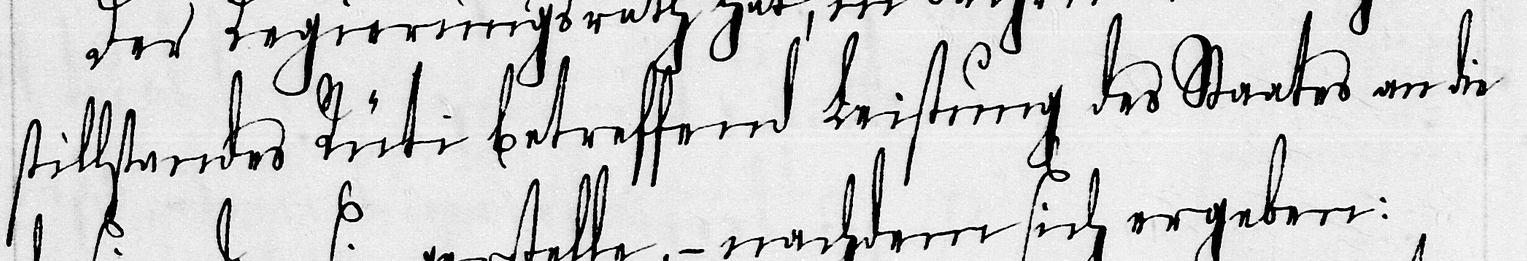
tillstandes Rüti betreffend Leistung des Staates an die
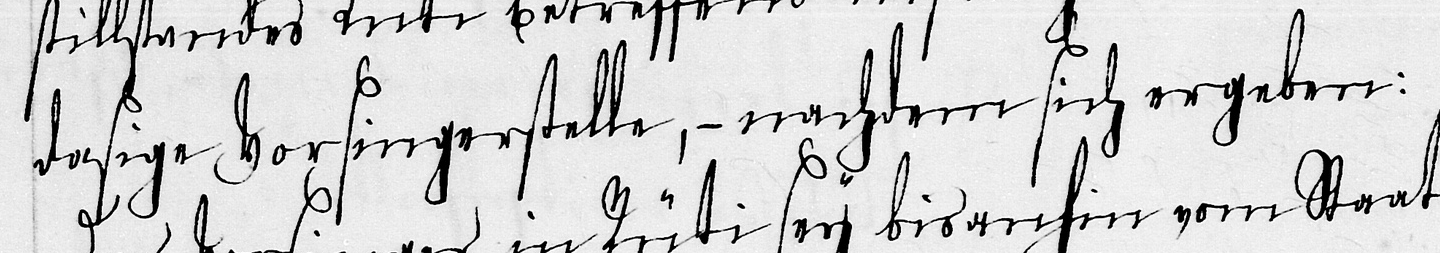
dasige Vorsingerstelle, – nachdem sich ergeben:
